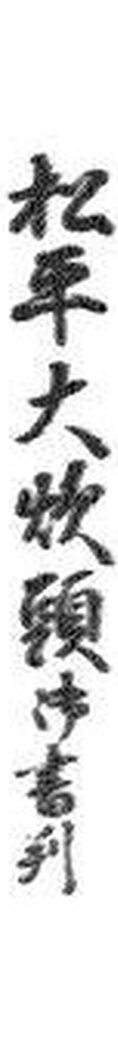松平大炊頭御書判
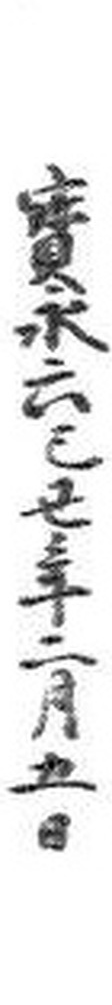宝永六已丑年二月五日
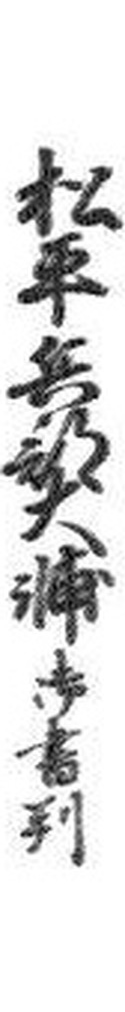松平兵部大輔御書判
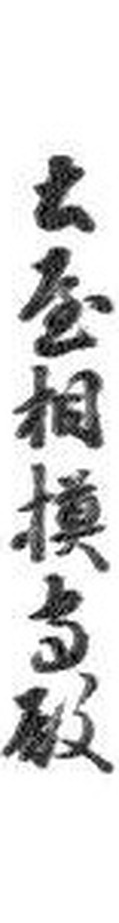土屋相模守殿

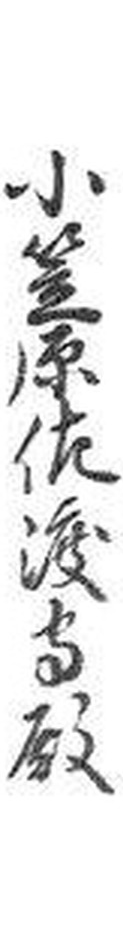小笠原佐渡守殿
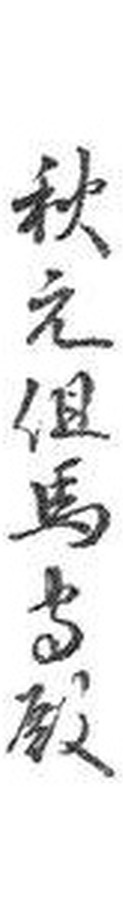秋元但馬守殿
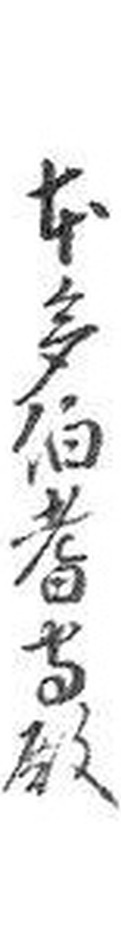本多伯耆守殿
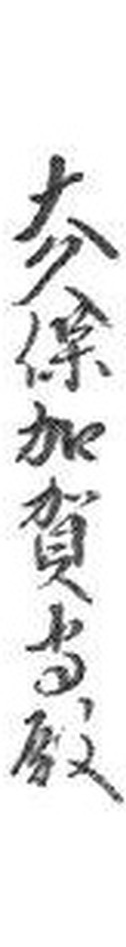大久保加賀守殿
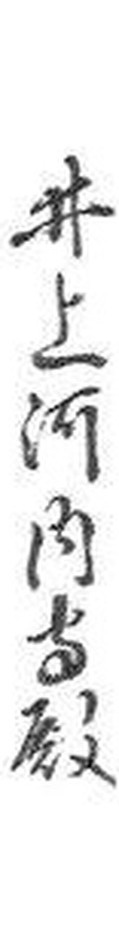井上河内守殿
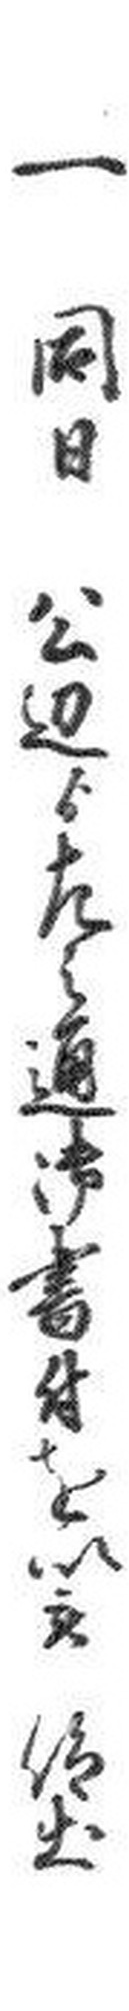一同日公辺ゟ左之通御書付を以被仰出
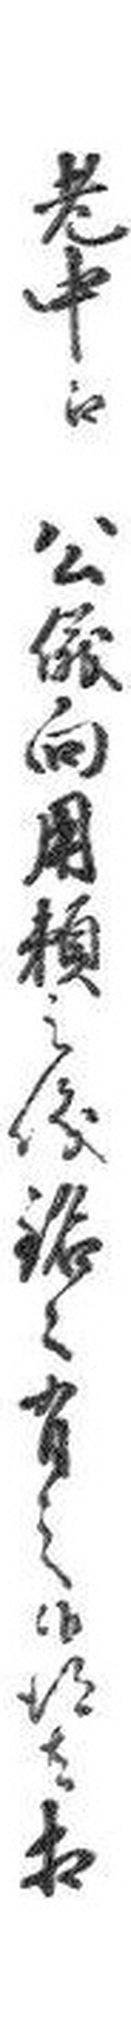老中江公儀向用頼之儀銘々有之候得共相
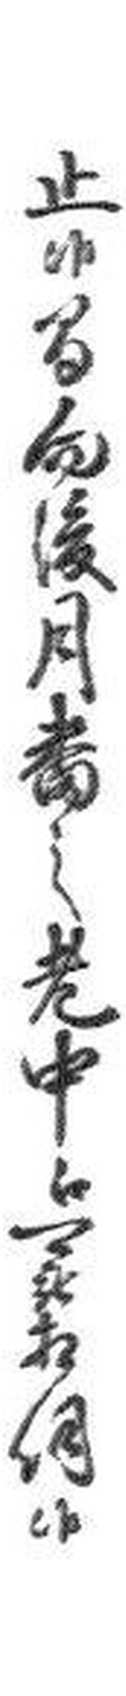止候間向後月番之老中可被相伺候
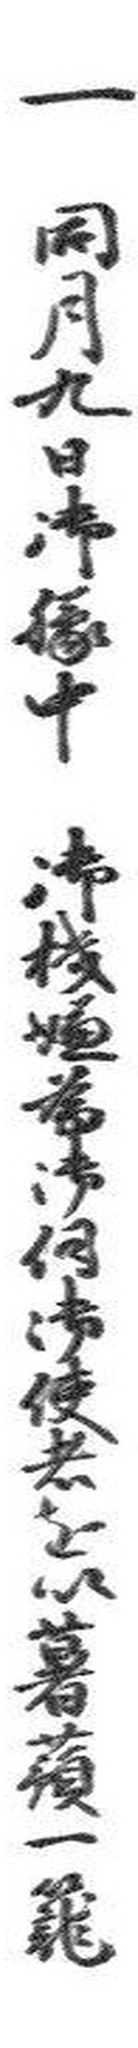一同月九日御朦中御機嫌為御伺御使者を以薯蕷一籠
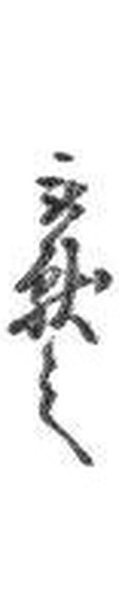被献之
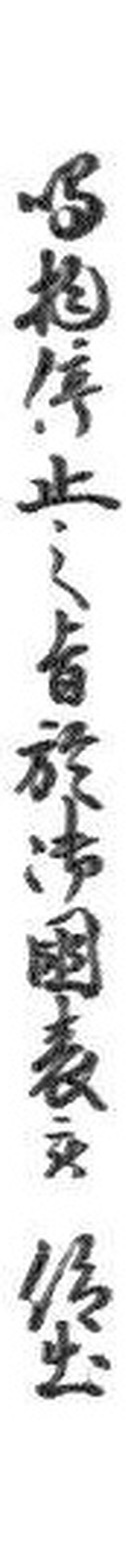鳴物停止之旨於御国表被仰出
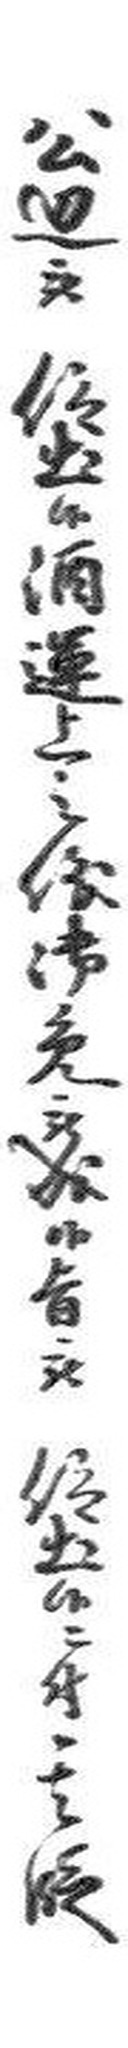公辺被仰出候酒運上之儀御免被成候旨被仰出候ニ付其段
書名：家譜 二十五 吉品公 従宝永六年到同七年
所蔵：福井県文書館 Fukui Prefectural Archives
